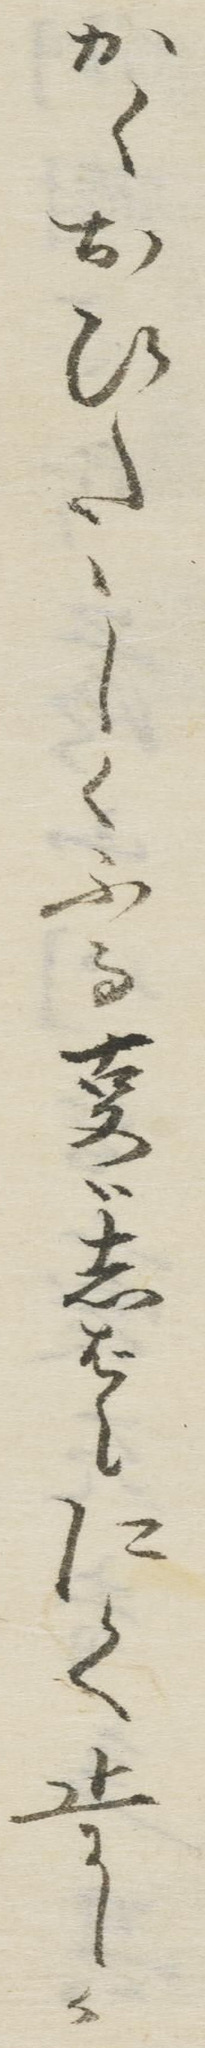かくおひたゝしくふる事ハしばしにて止にしが
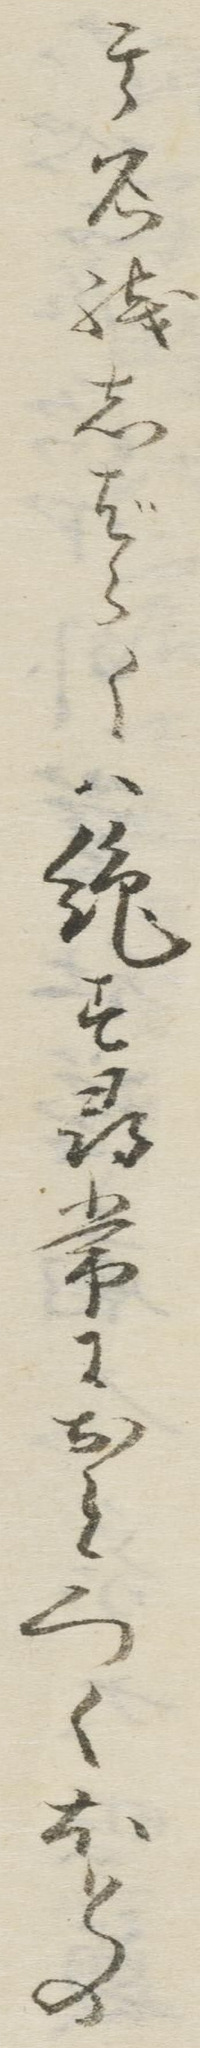其名残しばらくハ絶す尋常におちつくなとの
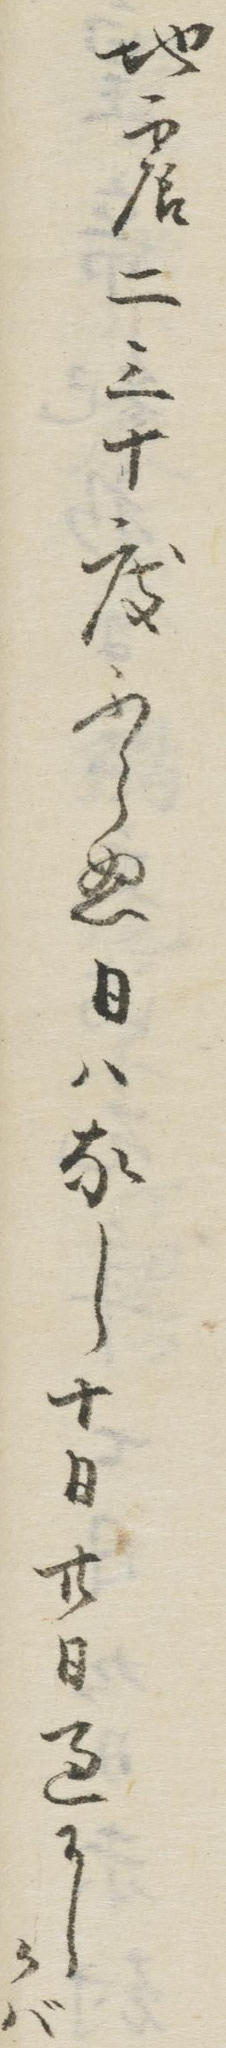地震二三十度ふらぬ日ハなし十日廿日過なラバ
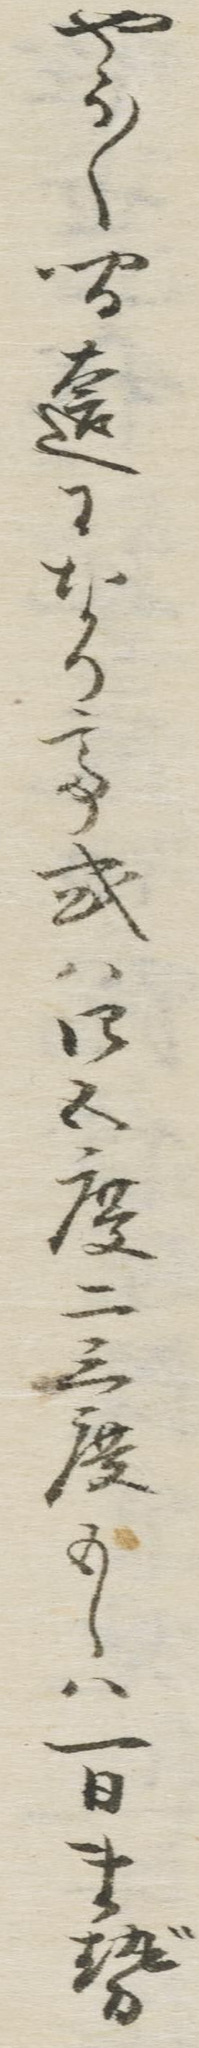やう〳〵鳴遠になりて或ハ四五度二三度も候ハ一日まぜ
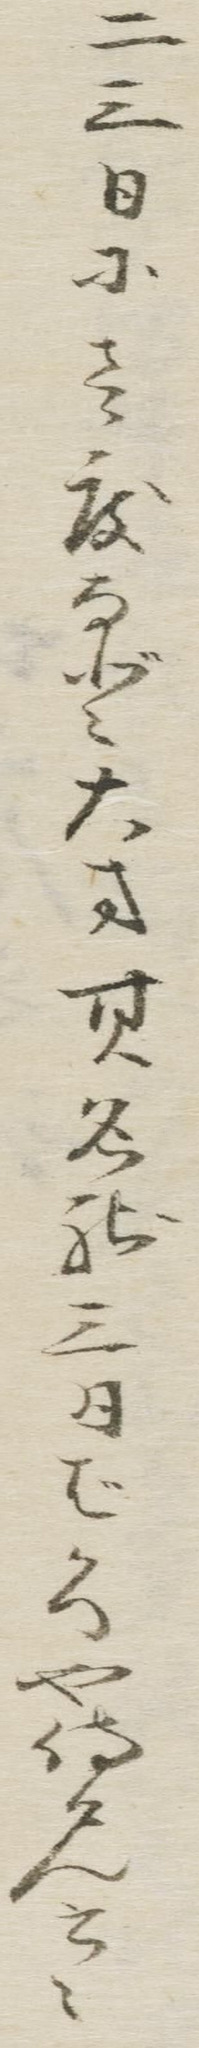二三日に壱度など大方其名残三月ばかり也侍見云々
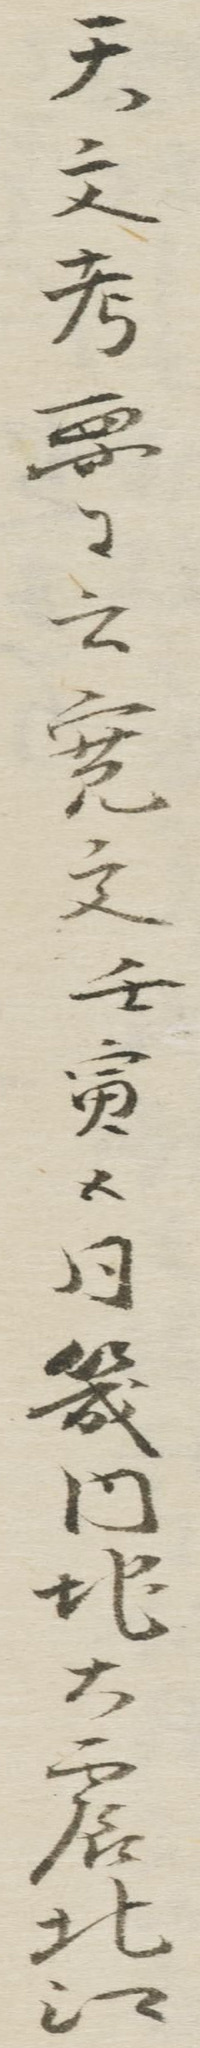天文考要に云寛文壬寅五月畿内地大震北江
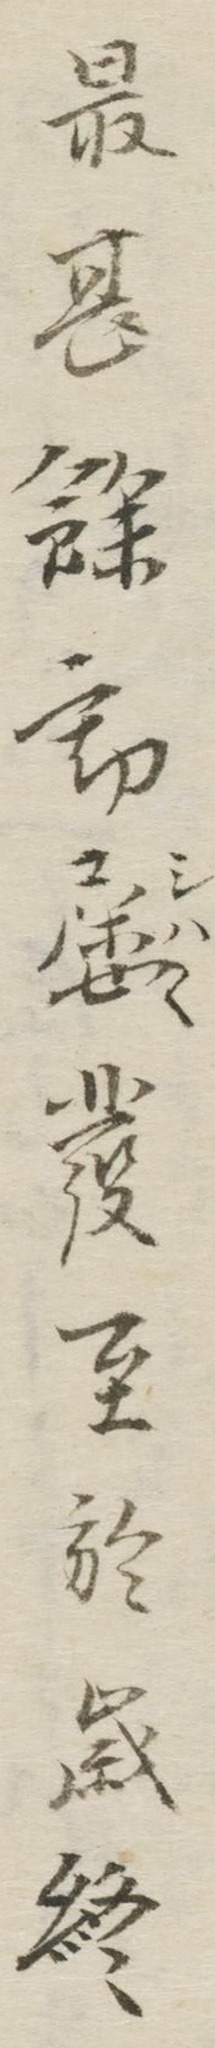最甚余動屡発至於歳終
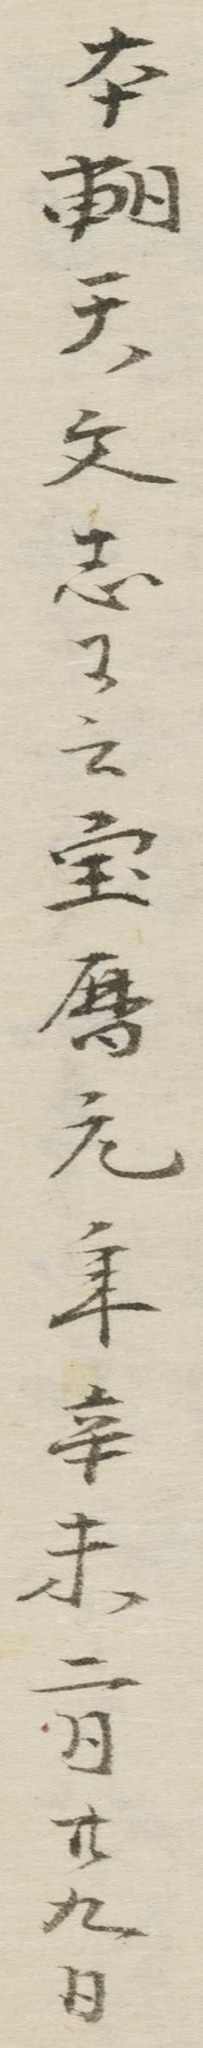本朝天文志に云宝暦元年辛未二月廿九日
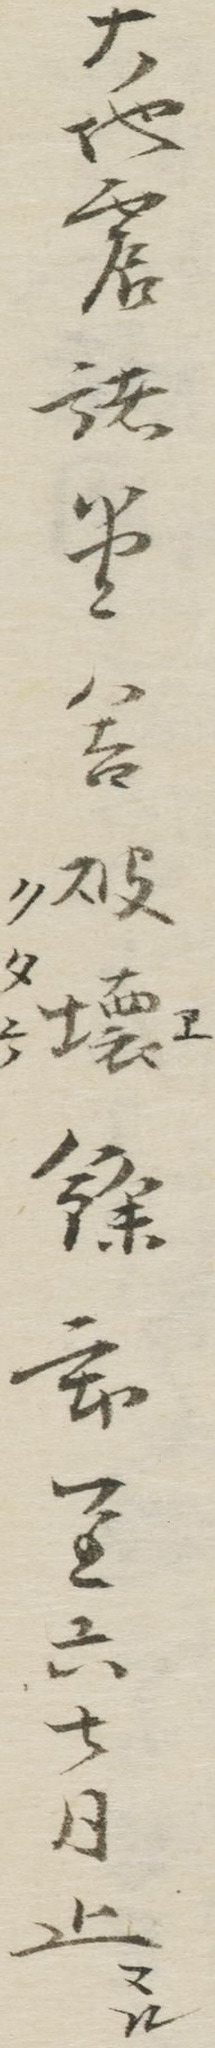大地震諸堂舎破壊余動閏六七月止マル
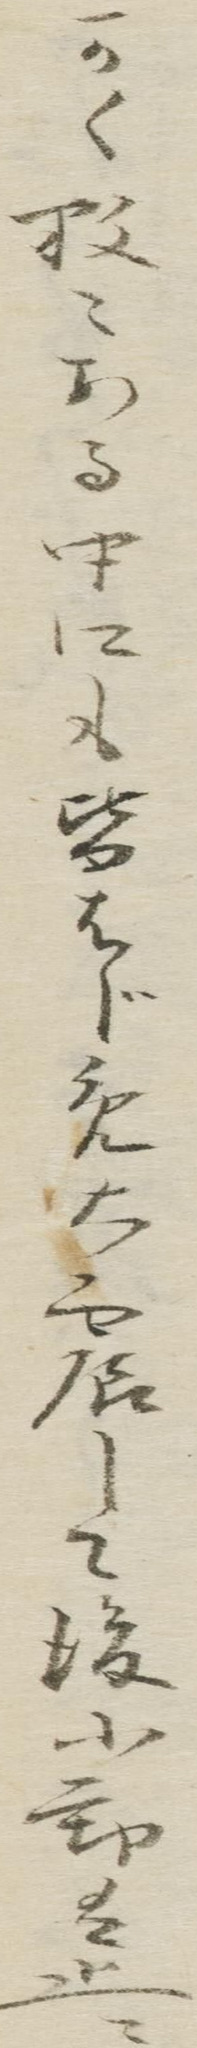かく数々ある中にも皆はじめ大震して後小動は止ニ

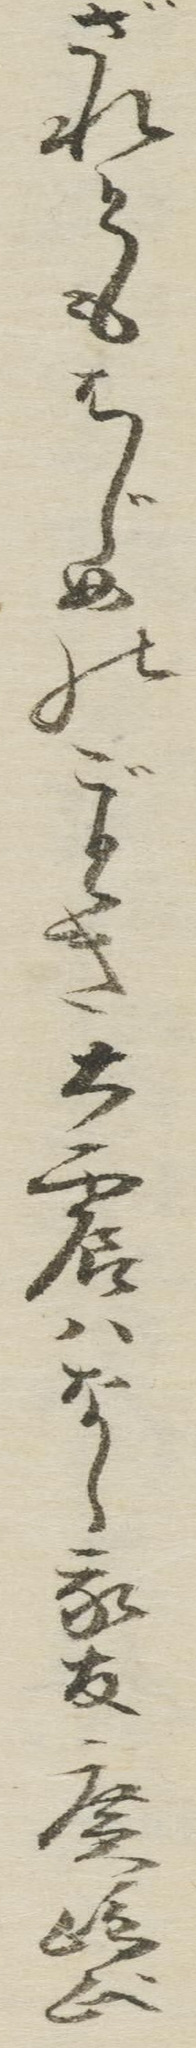ざれともはじめのごとき大震ハなし我友広嶋氏
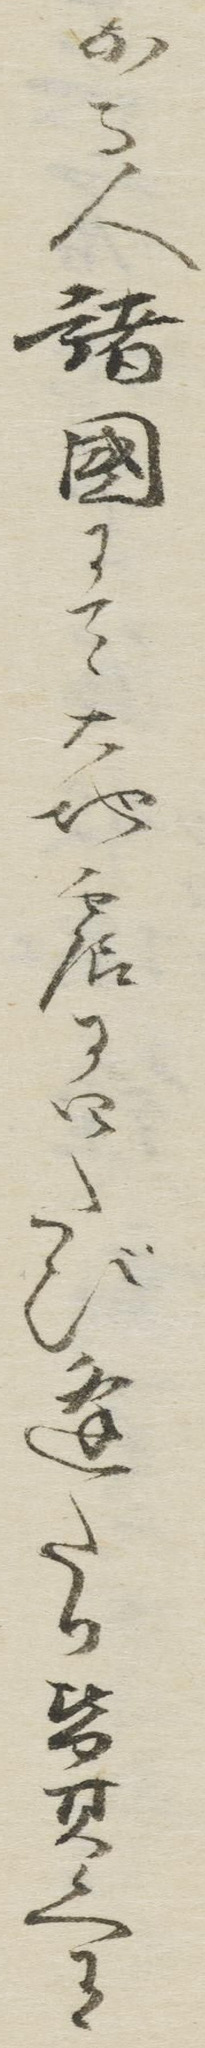なるひと諸国にて大地震に四たび逢皆其上は
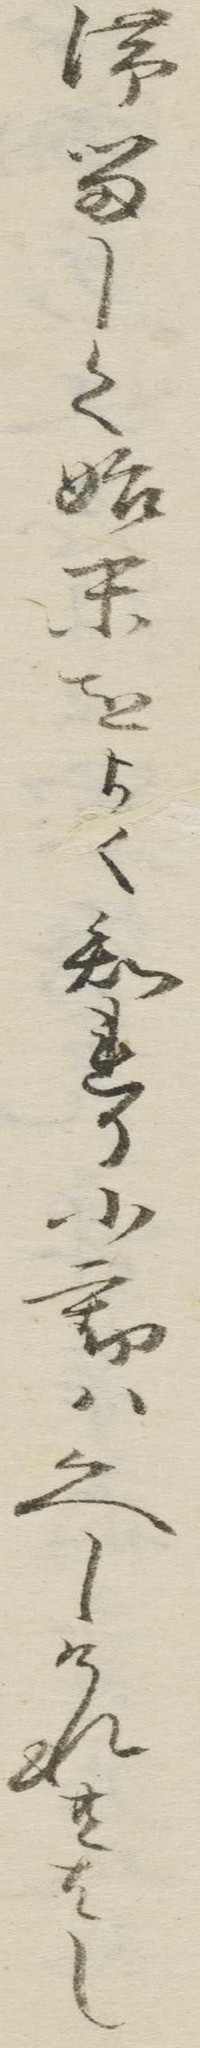滞留して始末をよく知れり小動ハ久しかれ共はし
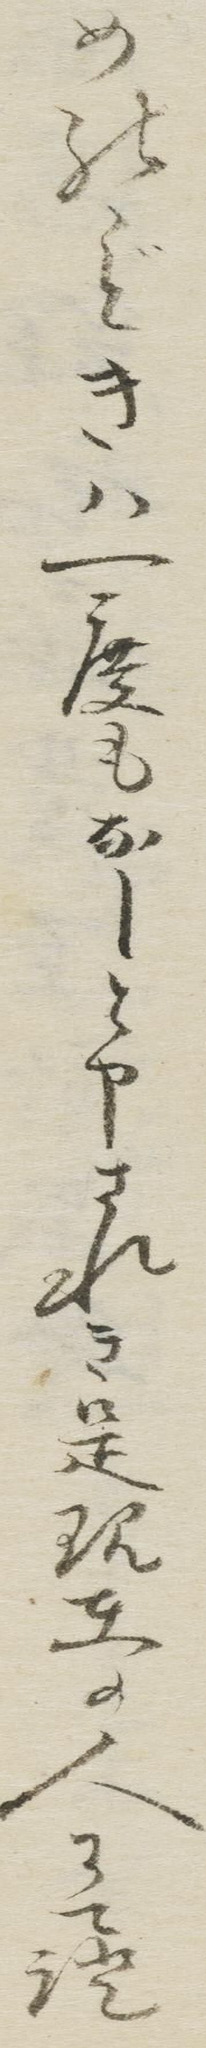めのごときハ一度もなしと申されき此れ現在の人にて證
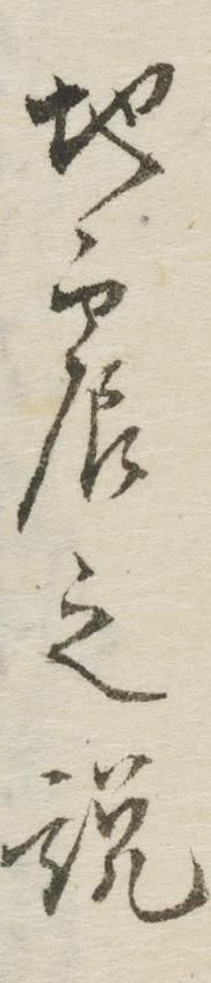地震之説
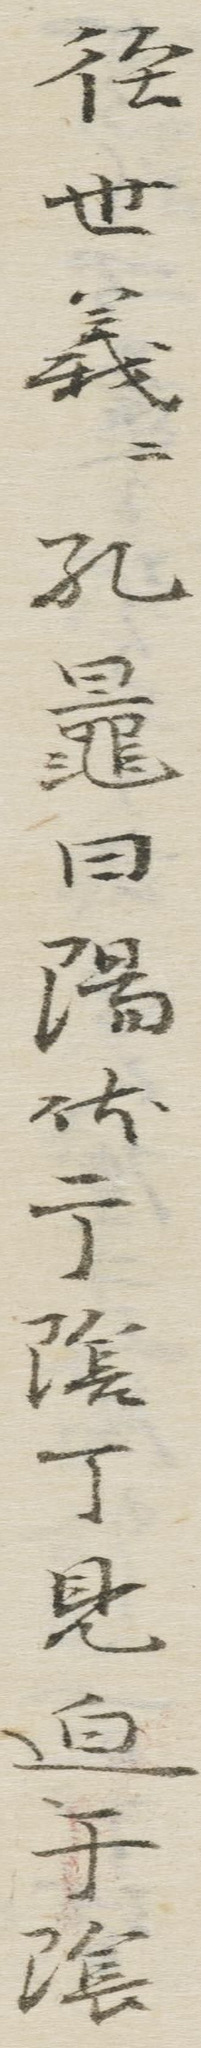径世義ニ孔亀曰陽伏テ陰に見迫于陰
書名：諸国大地震大津波一代記
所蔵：東京大学地震研究所図書室 Earthquake Research Institute Library, The University of Tokyo, JAPAN
